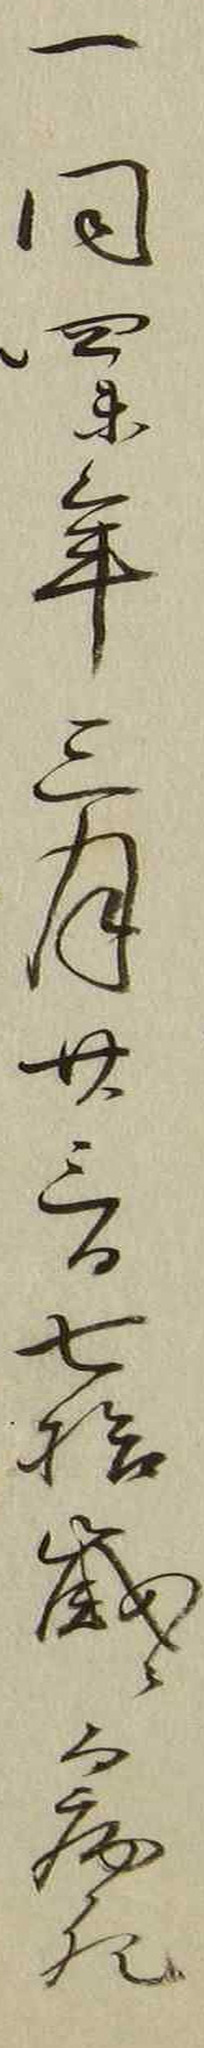一同四未年三月廿三日七拾歳ニ而病死
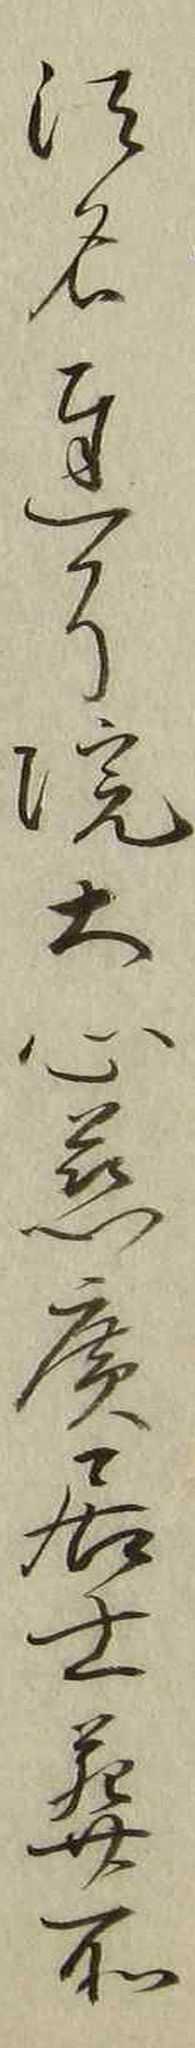法名達了院大心慈廣居士葬所
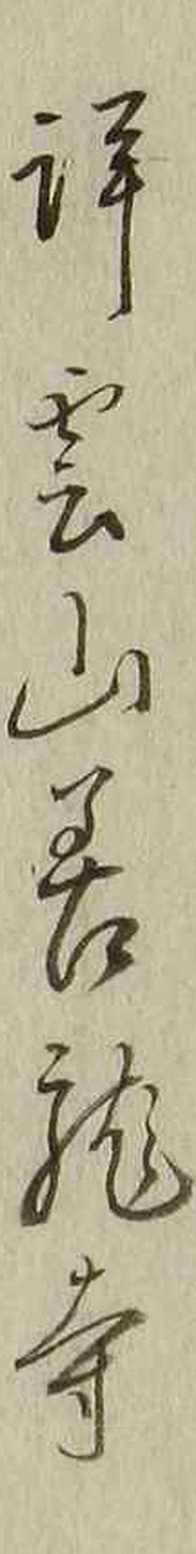祥雲山善龍寺
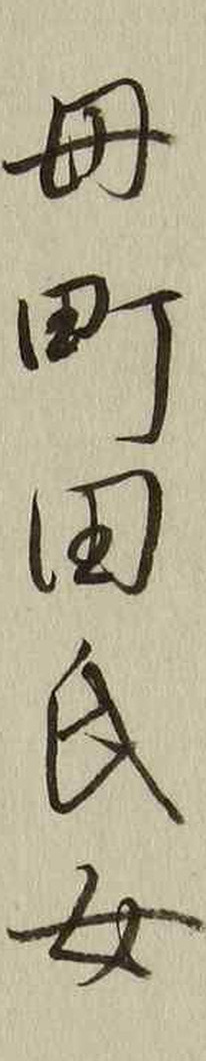母町田氏女
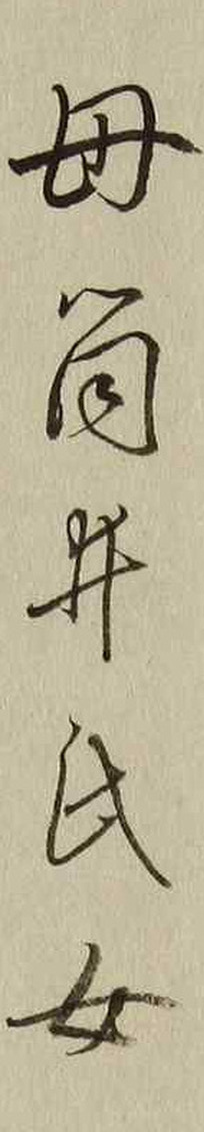母筒井氏女
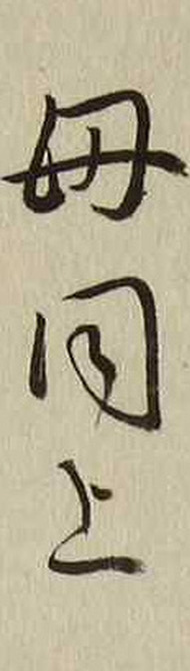母同上
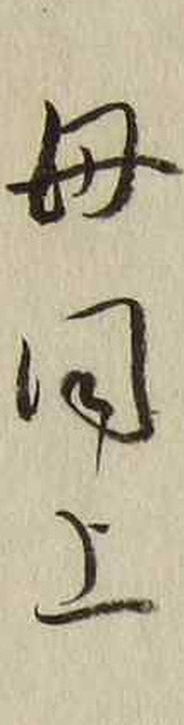母同上

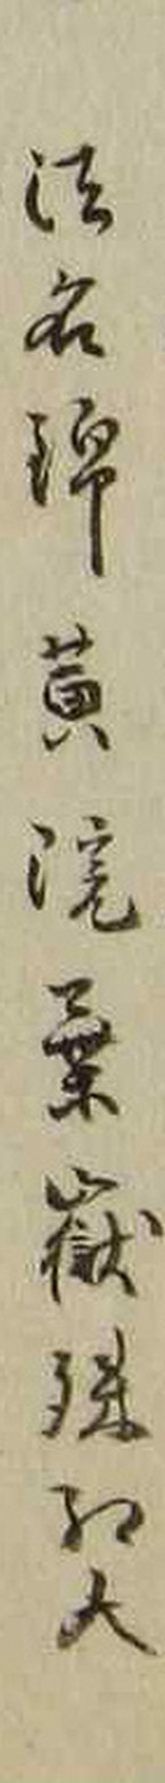法名錦黄院葉嶽殊紅大
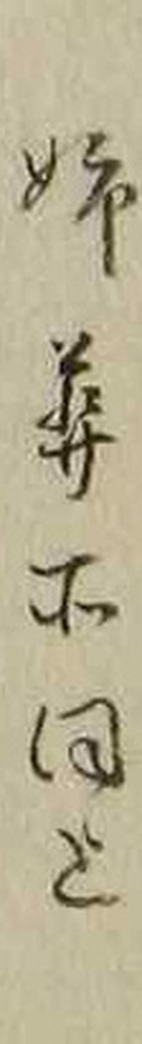姉葬所同上
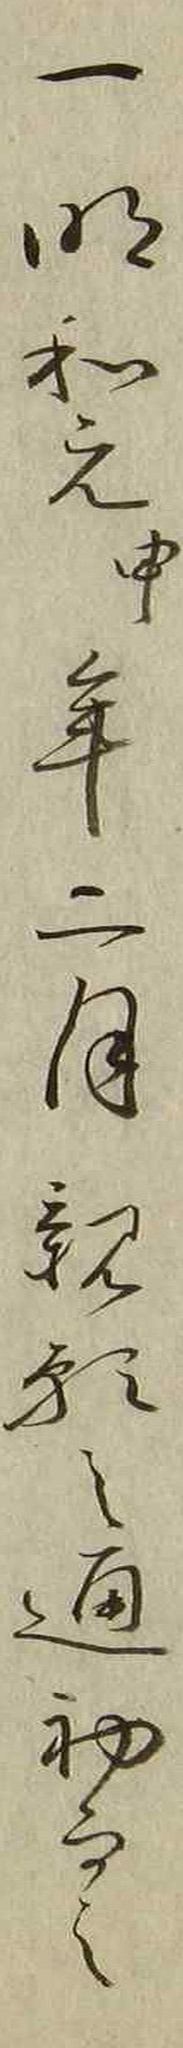一明和元申年二月親願之通初而之
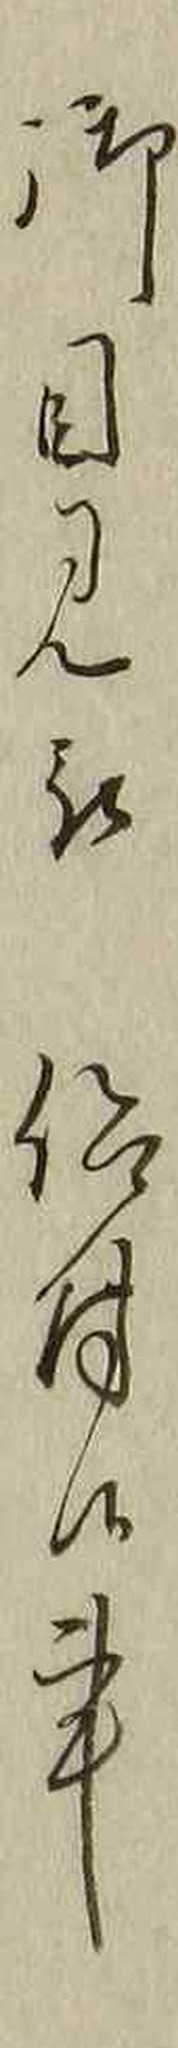御目見被仰付候事
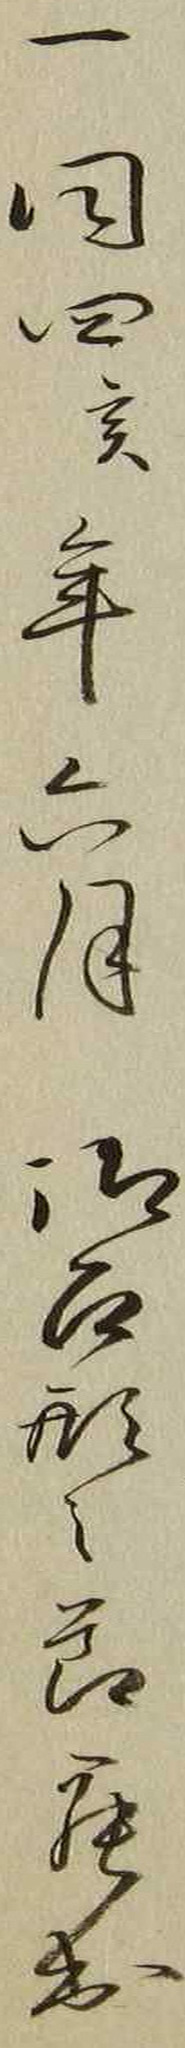一同四亥年六月御召形之節罷出
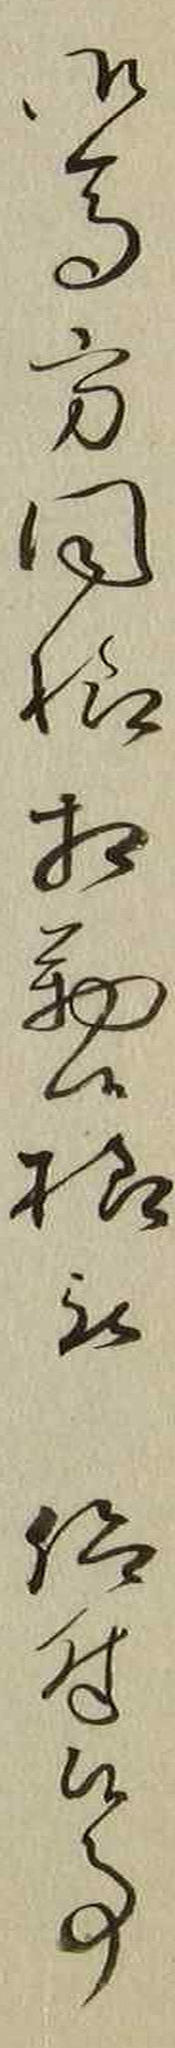御馬方同様相勤候様被仰付候事
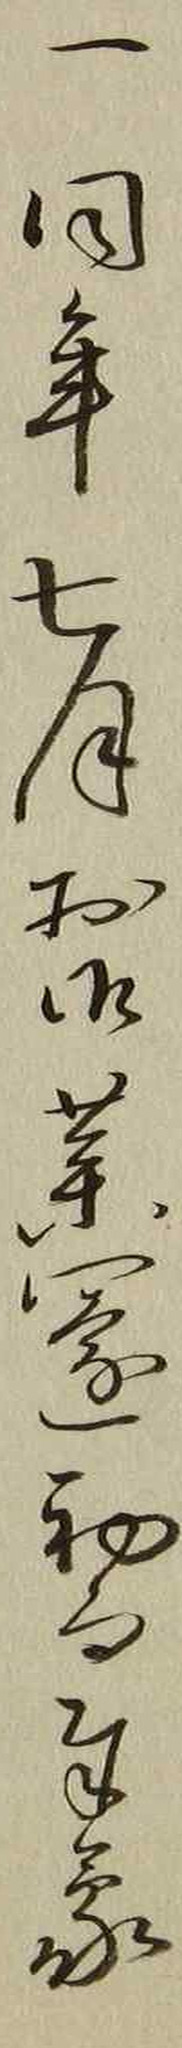一同年七月於御薬園初而奉蒙
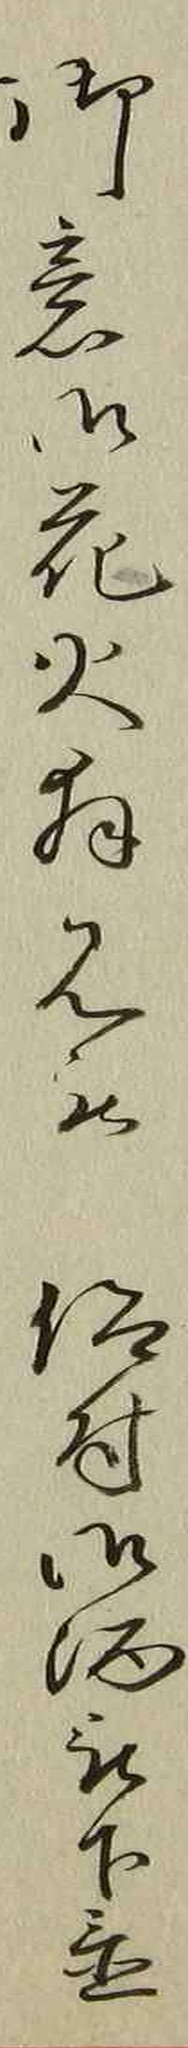御意御花火拝見被仰付御酒被下置
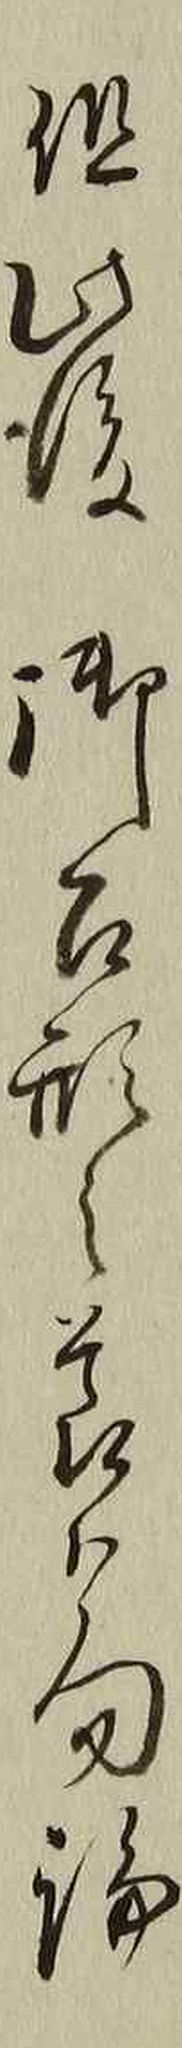但此後御召形之節ハ勿論
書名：諸士系譜　巻之3　い之部3
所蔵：会津若松市立会津図書館
